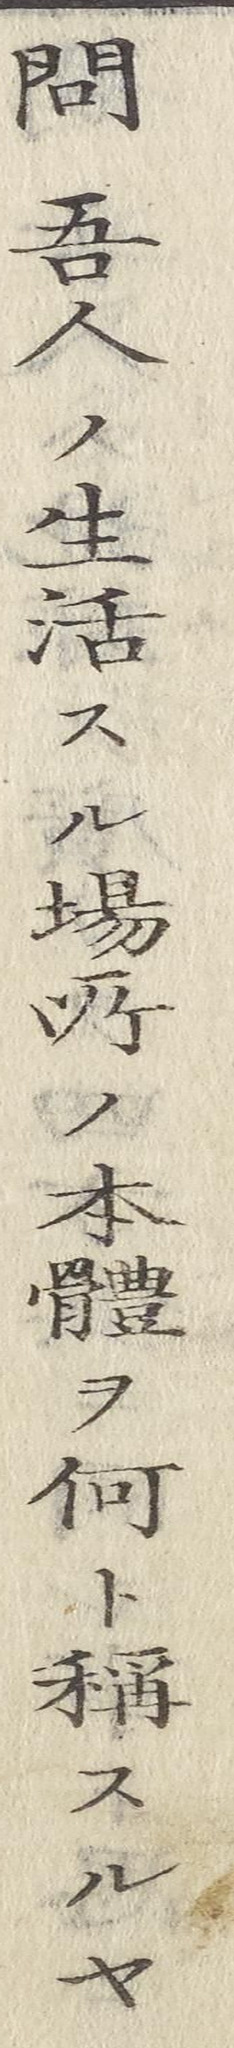問吾人ノ生活スル場所ノ本体ヲ何ト称スルヤ
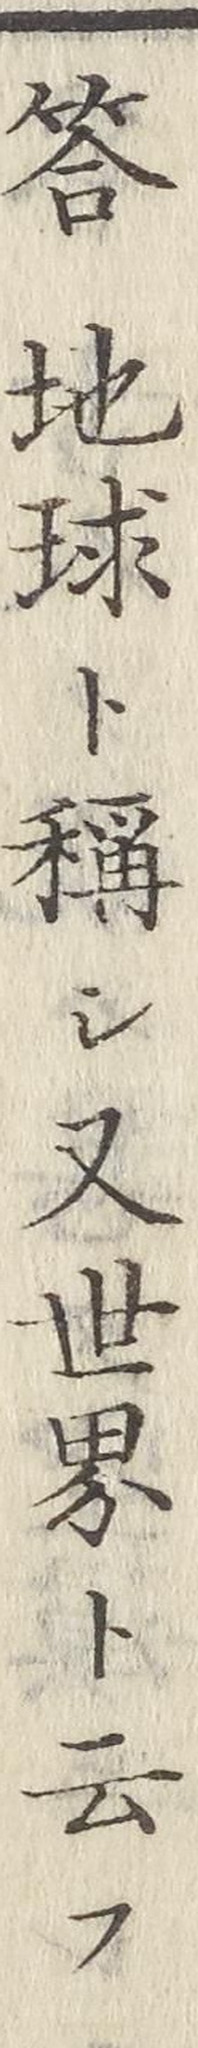答地球ト称シ又世界ト云フ
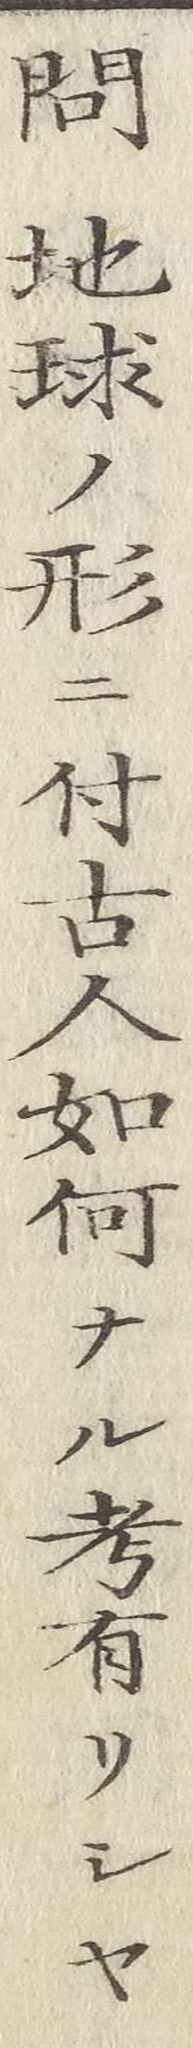問地球ノ形ニ付古人如何ナル考有リシヤ
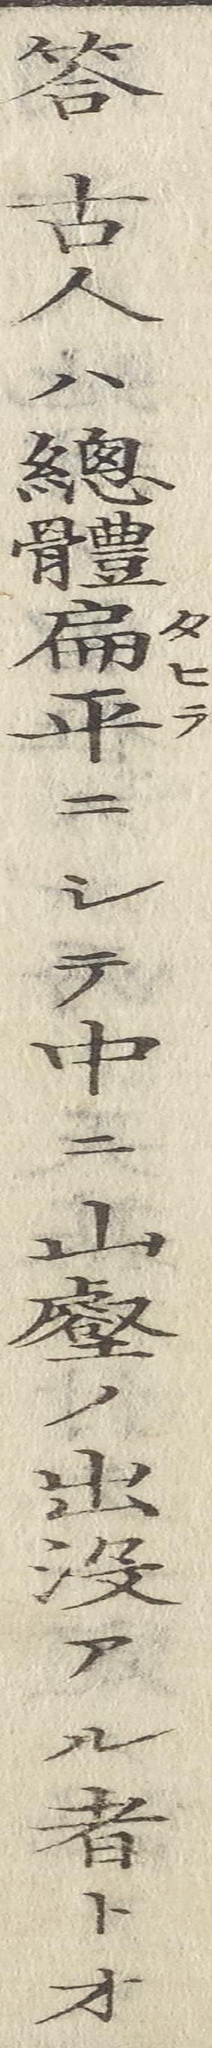答古人ハ総体扁平タヒラニシテ中ニ出没アル者トオ
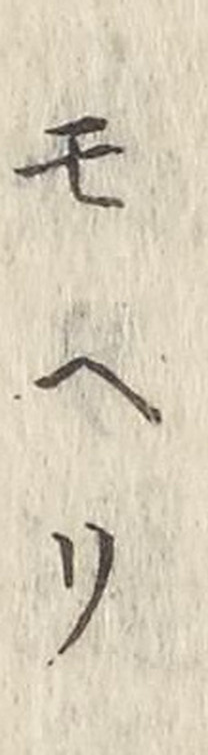モヘリ
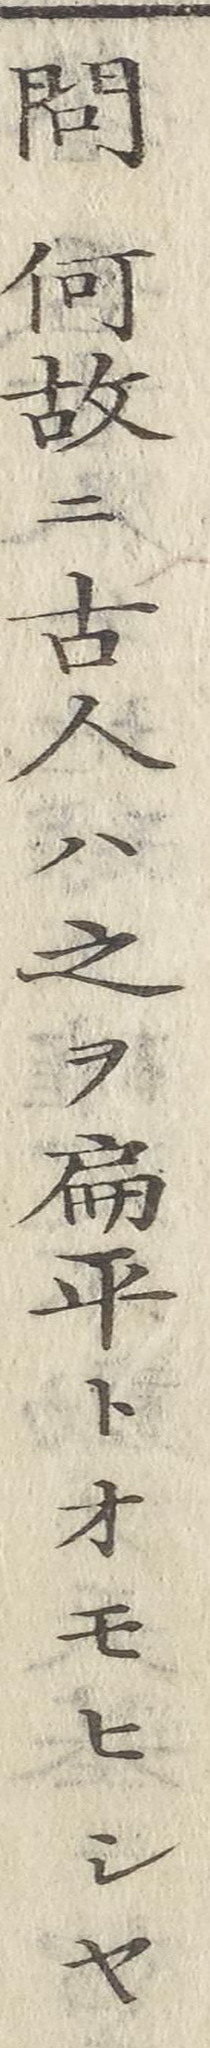問何故ニ古人ハ之ヲ扁平トオモヒシヤ
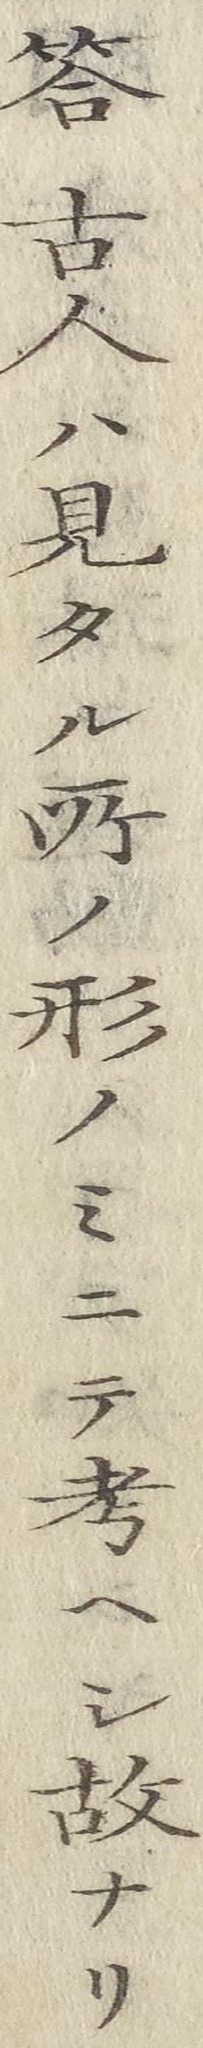答古人ハ見タル所ノ形ノミニテ考ヘシ故ナリ

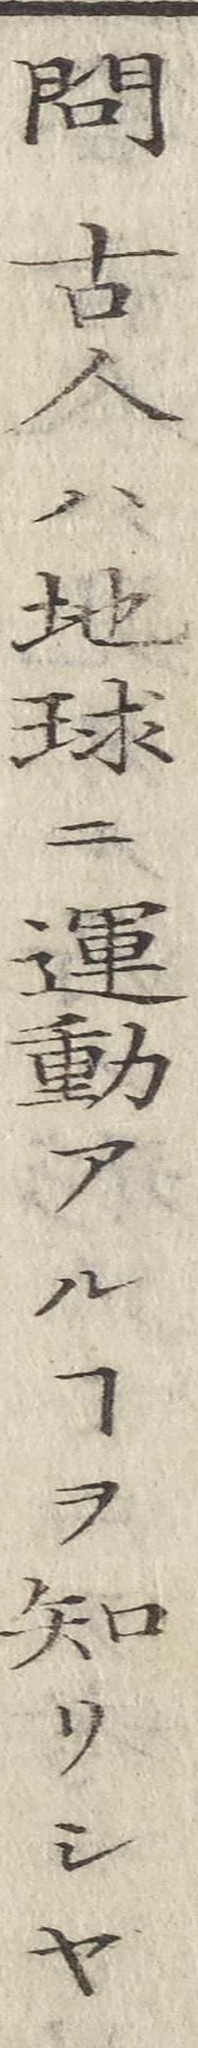問古人ハ地球ニ運動アルコトヲ知リシヤ
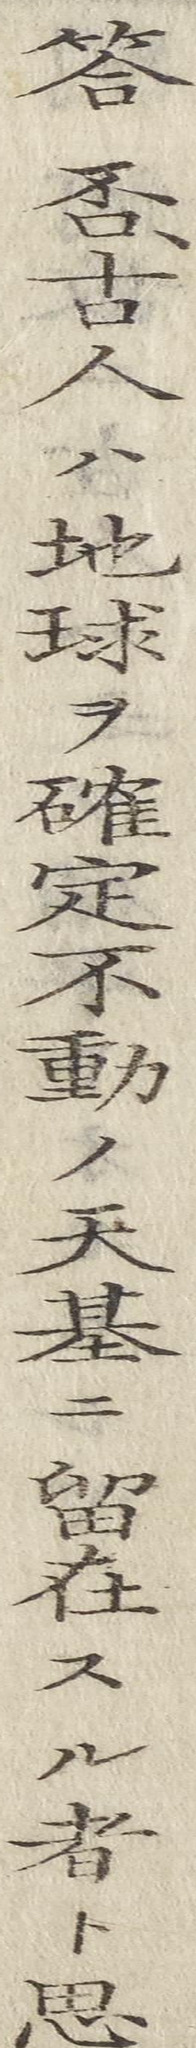答否、古人ハ地球ヲ確定不動ノ天基ニ留在スル者ト思
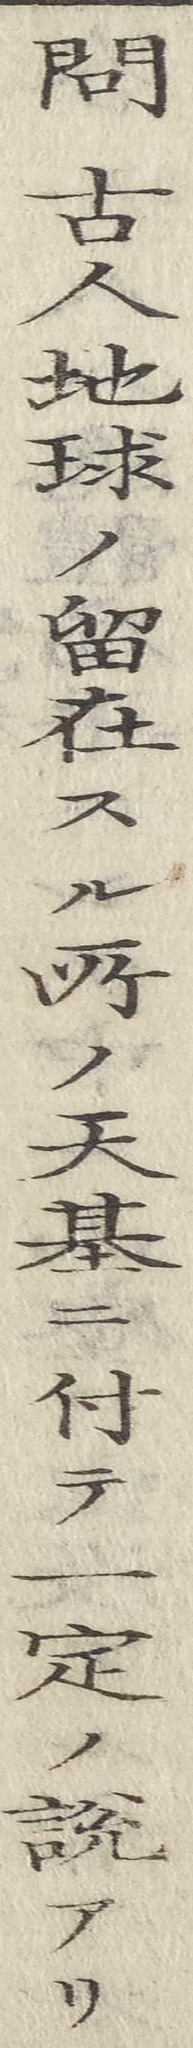問古人地球ノ留在スル所ノ天基ニ付テ一定ノ説アリ
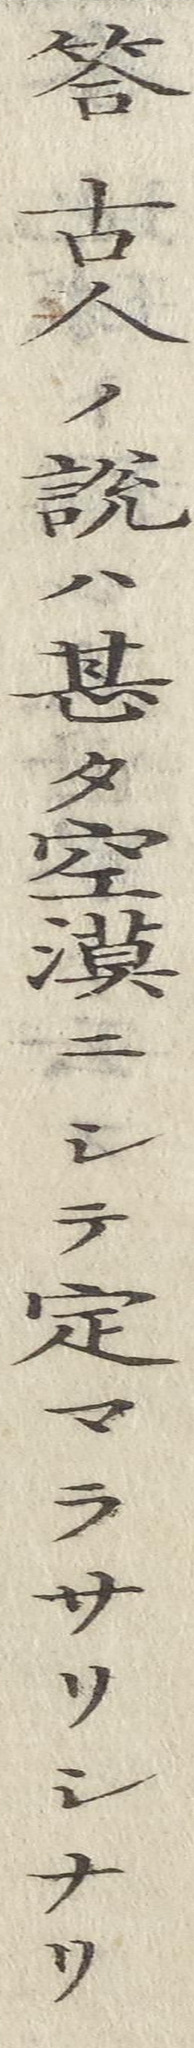答古人ノ説ハ甚ダ空漠シニテ定マラサリシナリ
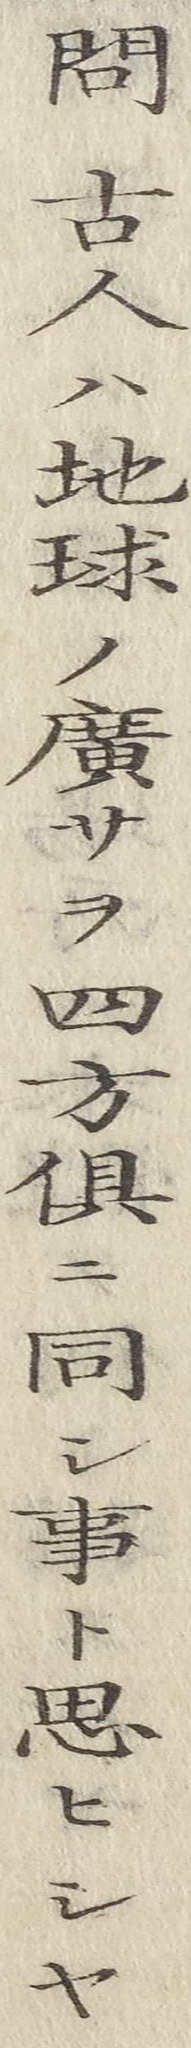問古人ハ地球ノ広サヲ四方俱ニ同シ事ト思ヒシヤ
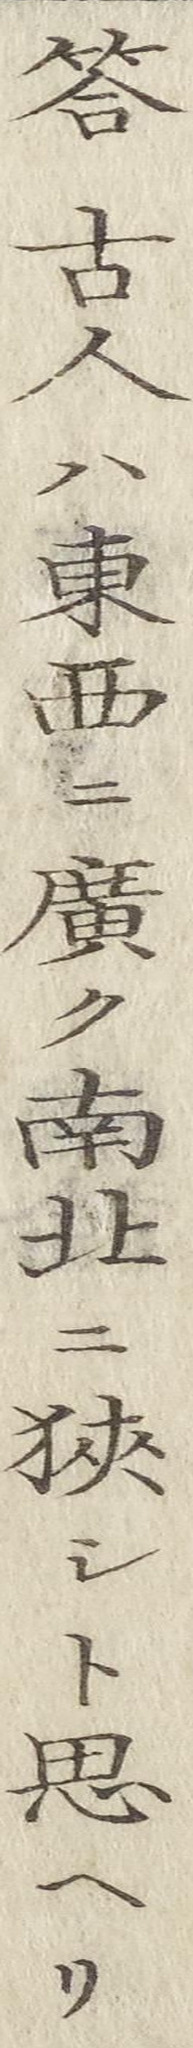答古人ハ東西ニ広ク南北ニ狭シト思ヘリ
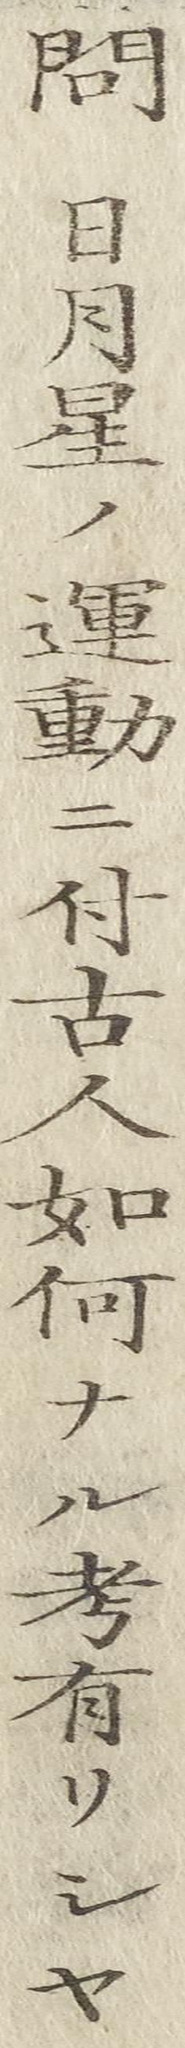問日月星ノ運動ニ付古人如何ナル考有リシヤ
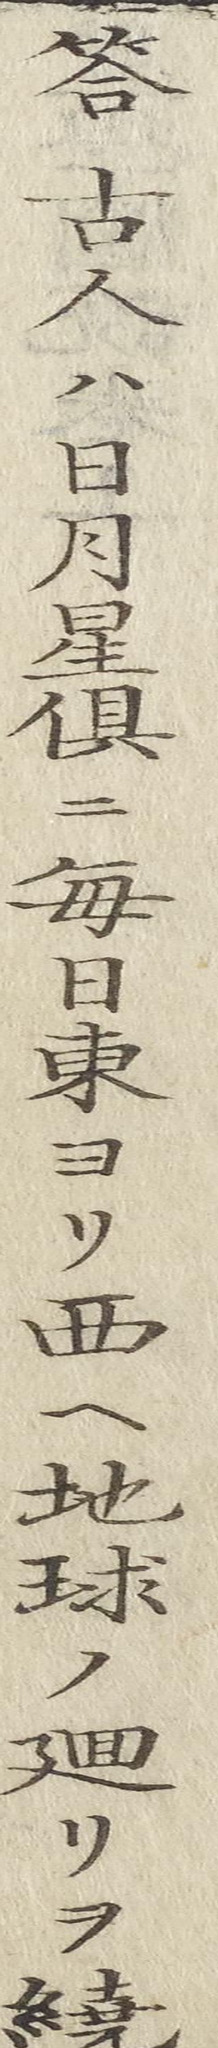答古人ハ日月星俱ニ毎日東ヨリ西ヘ地球ノ廻リヲ繞
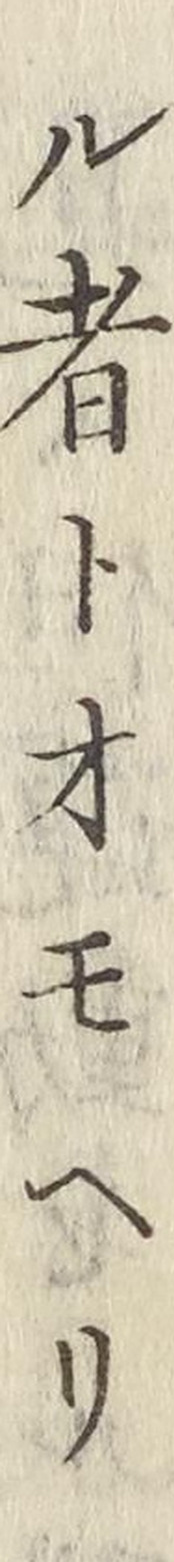ル者トオモヘリ
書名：星学圖説　上
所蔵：東京大学地震研究所図書室 Earthquake Research Institute Library, The University of Tokyo, JAPAN
